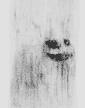二
